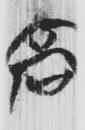高
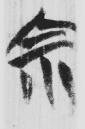宗
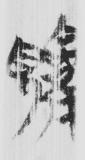觀
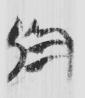於
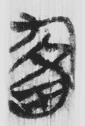{勹备}
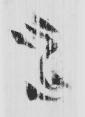水
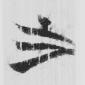之
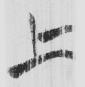上
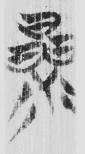參
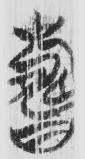壽
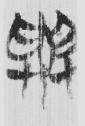與
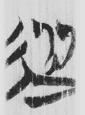從
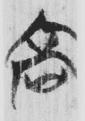高
